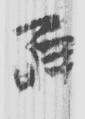唯
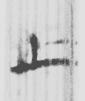上
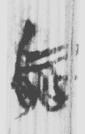能
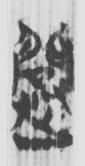{興止}
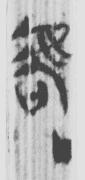唬
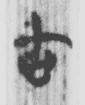古
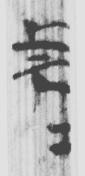{上下}=
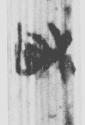相
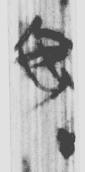安
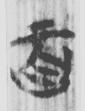百
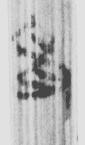眚
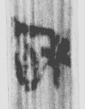和
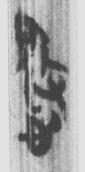{兌攴心}
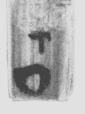{十四}
